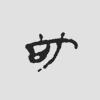可
